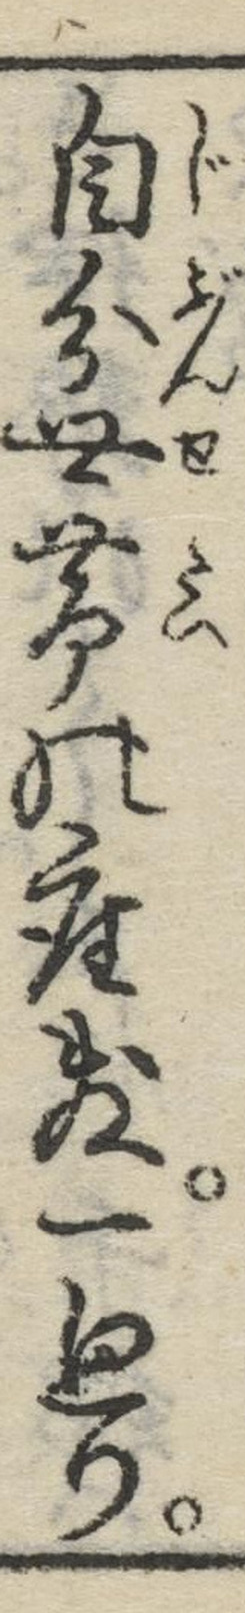自分世帯の座敷。一廻り。
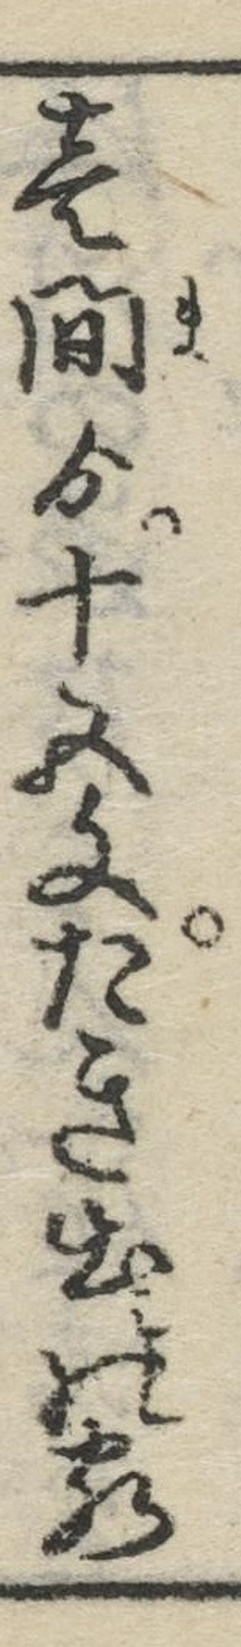壱間ゟ。十五文。たき出しの数
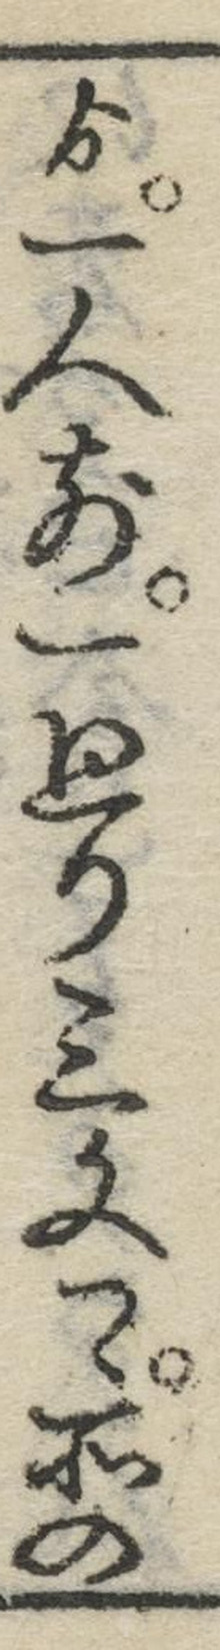ゟ。一人前。一廻り三文つゝ。所の
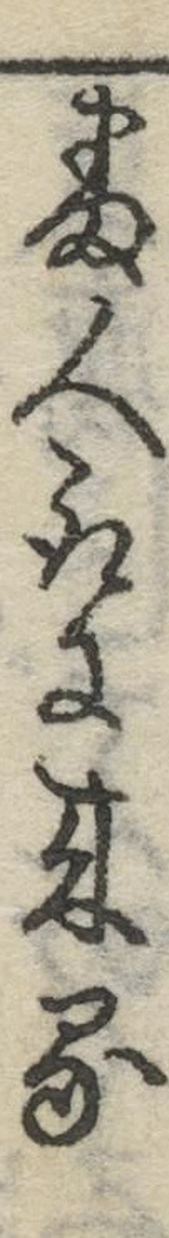番人。取に来る
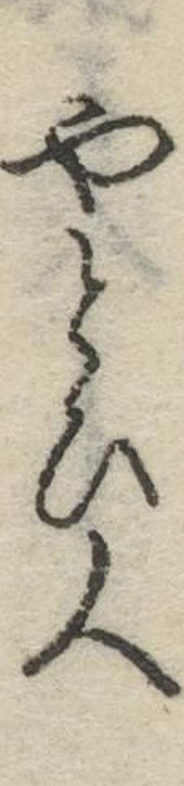やとひ人
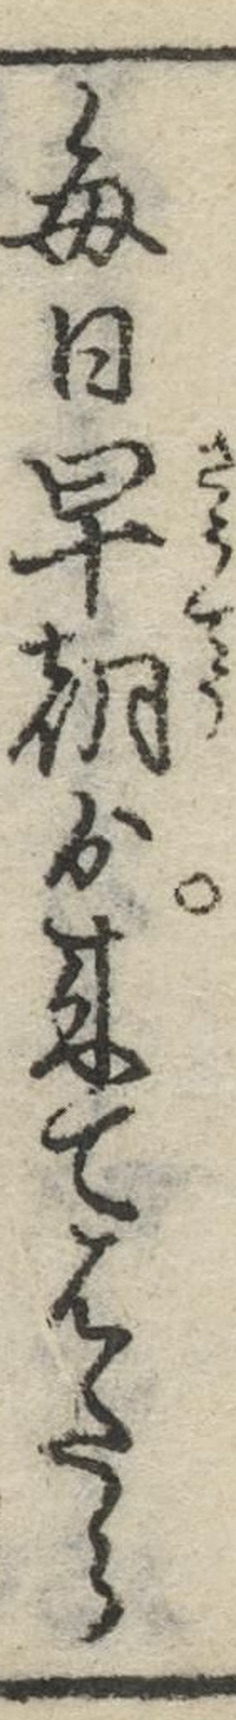毎日早朝ゟ。来てはたら
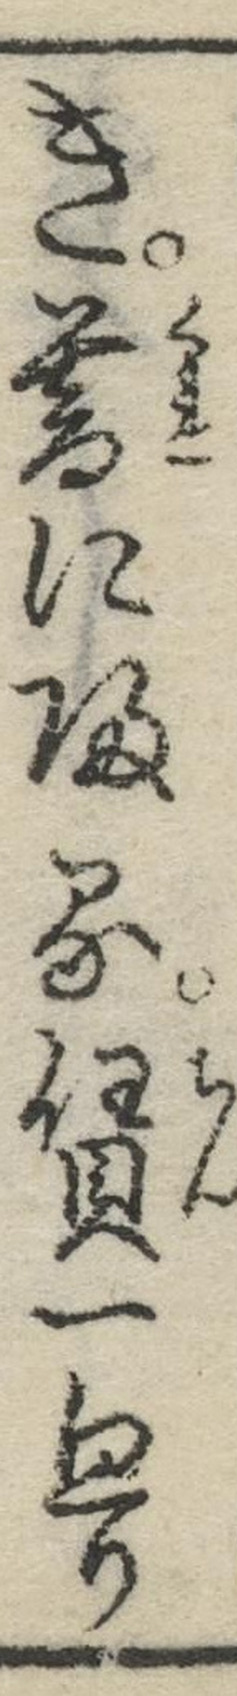き。暮に帰る。賃一廻り
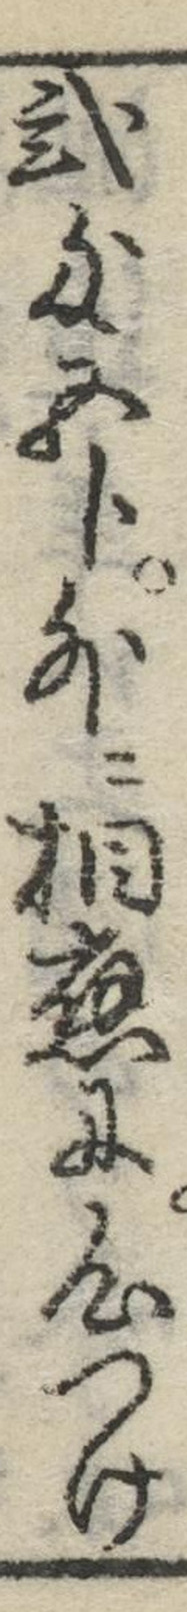弐匁五分。外に相応に。心つけ
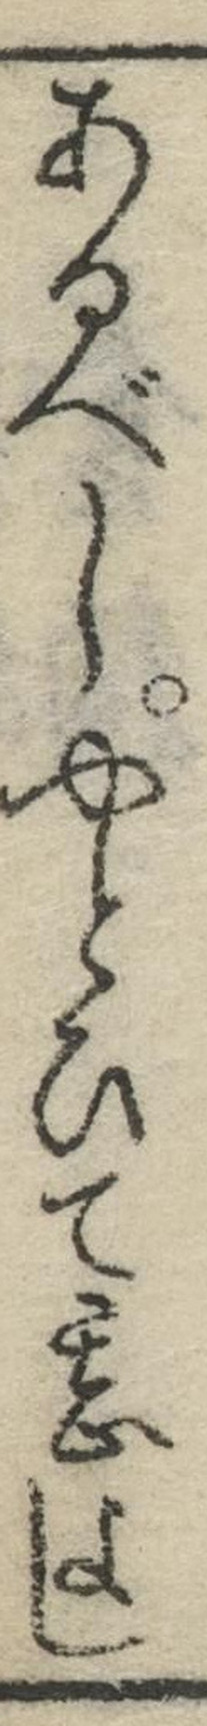あるべし。やとひて甚よし

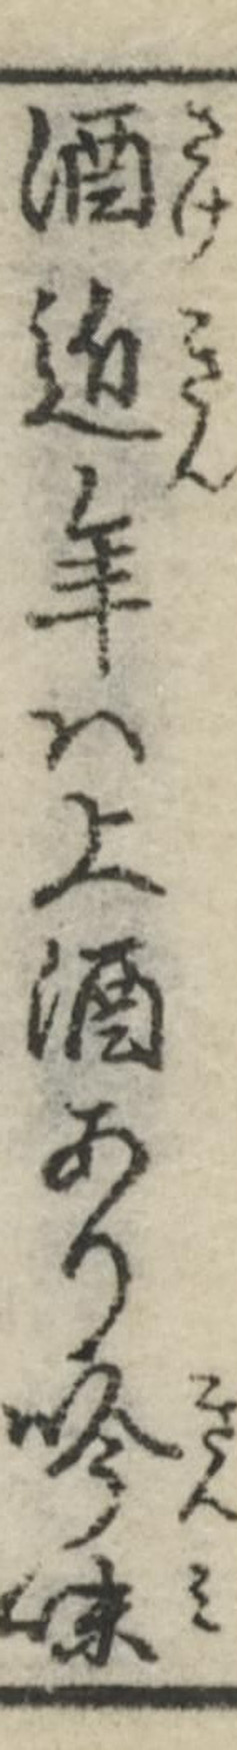酒近年は上酒あり吟味
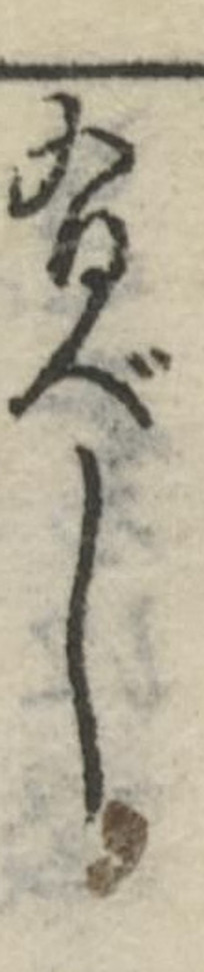有べし
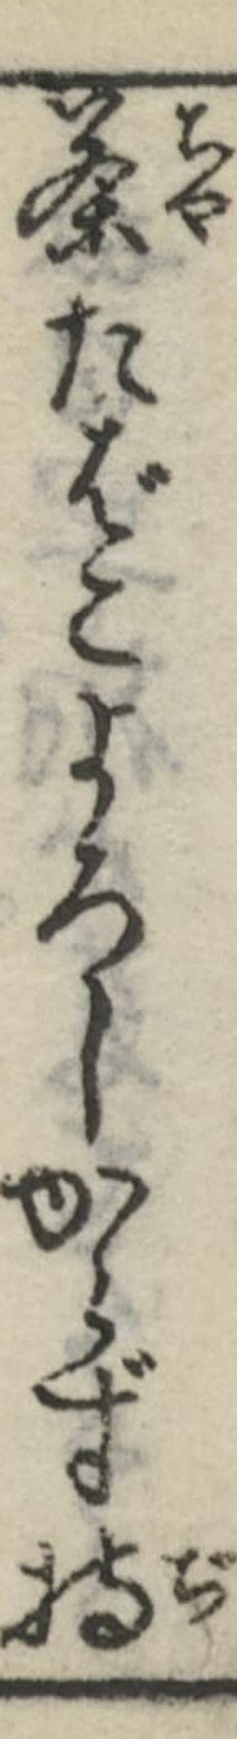茶たばこよろしからず持
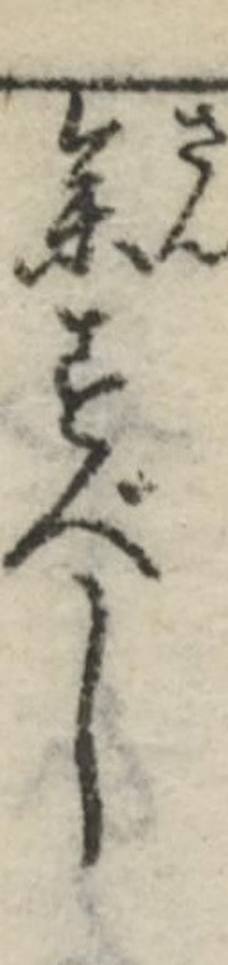参すべし
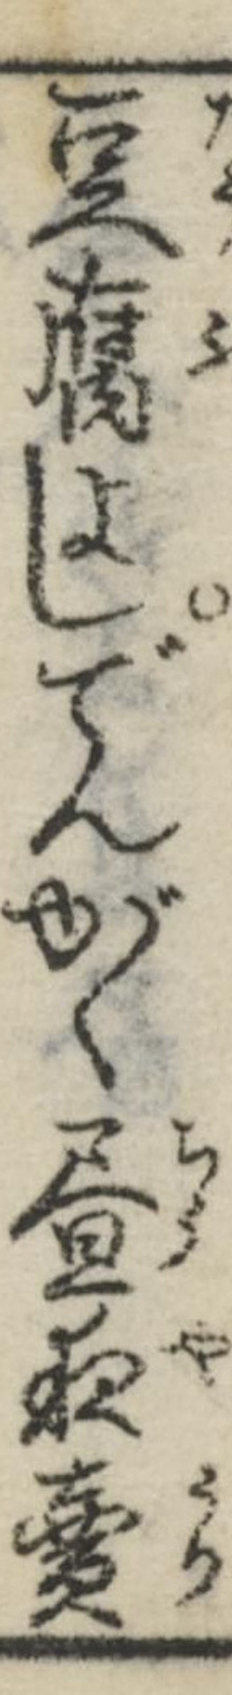豆腐よし。でんがく昼夜売
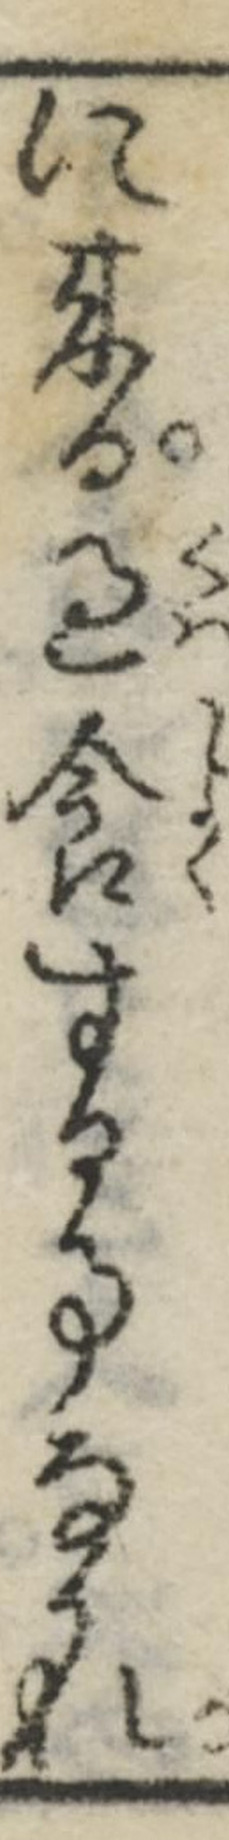に来る。過食する事なかれ。
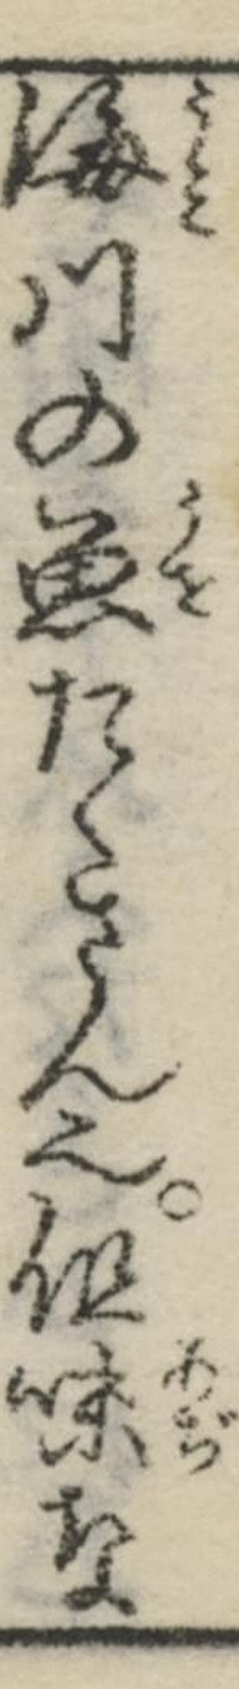海川の魚たくさん也。但味な
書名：但州城崎浴湯辧
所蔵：東京大学地震研究所図書室 Earthquake Research Institute Library, The University of Tokyo, JAPAN
